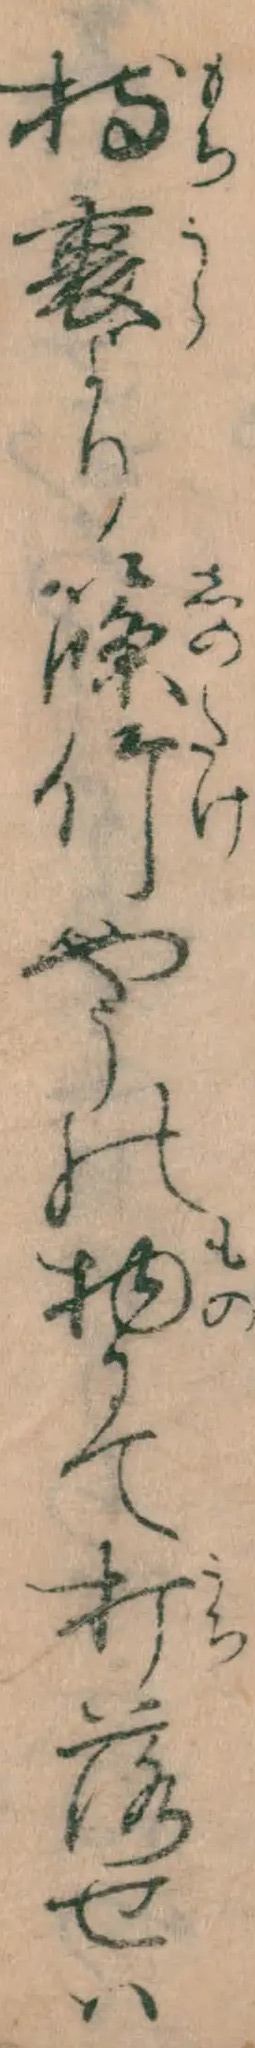持裏より篠竹やうの物にて打落せは
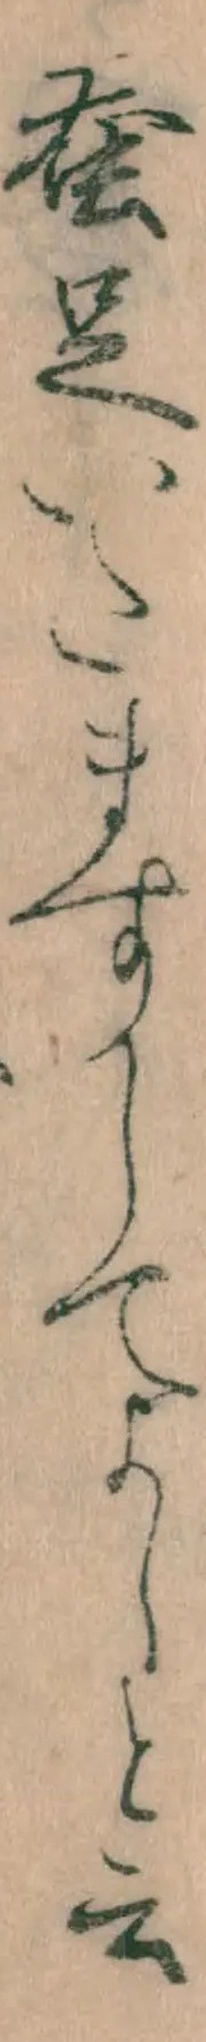蚕足いたますしてよしと云
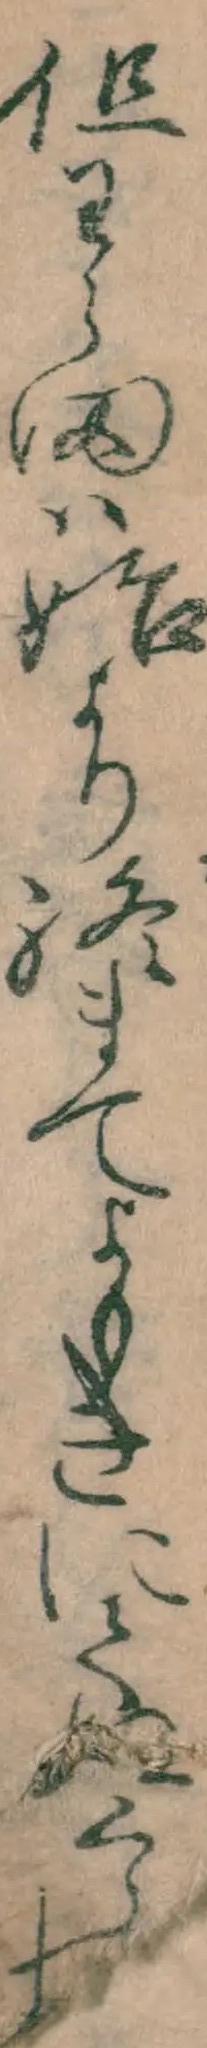但わら田は始より終まてよもきにてぬく

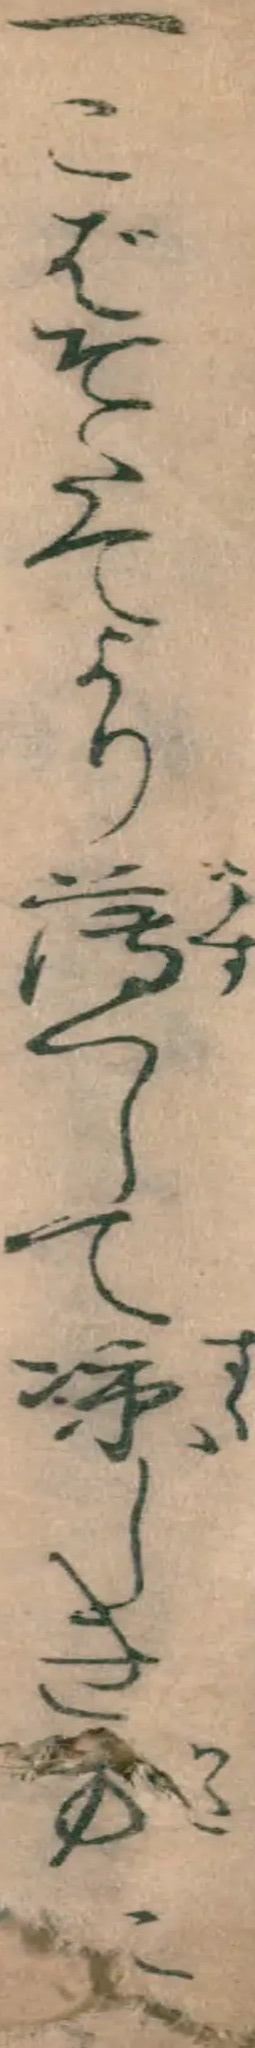一こばそたてより薄くして涼しき方
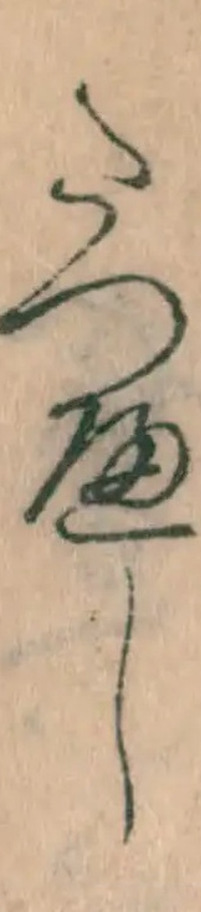たつへし
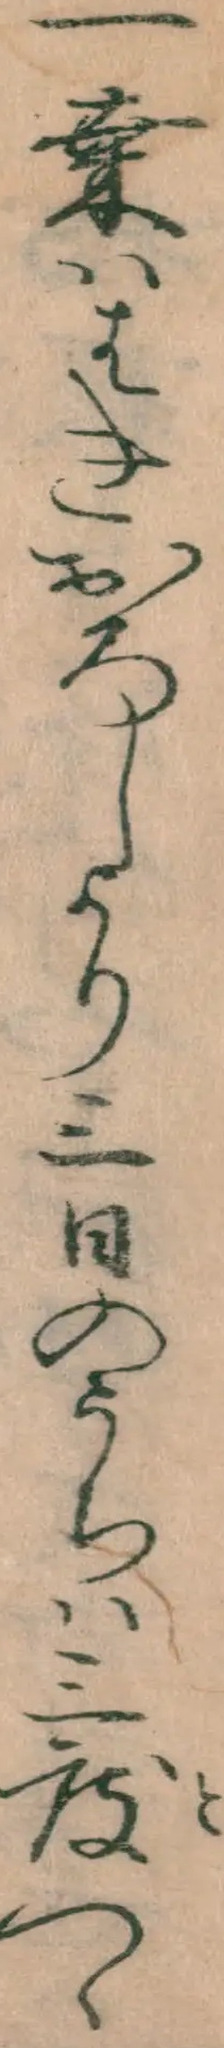一桑ははきおろしより三日のうちは三度つゝ
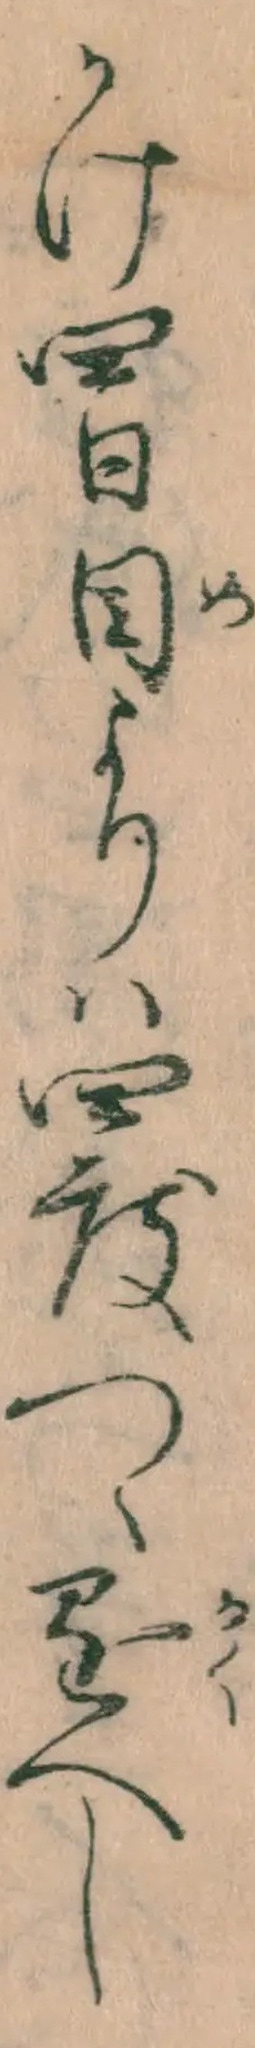かけ四日目よりは四度つゝ懸へし
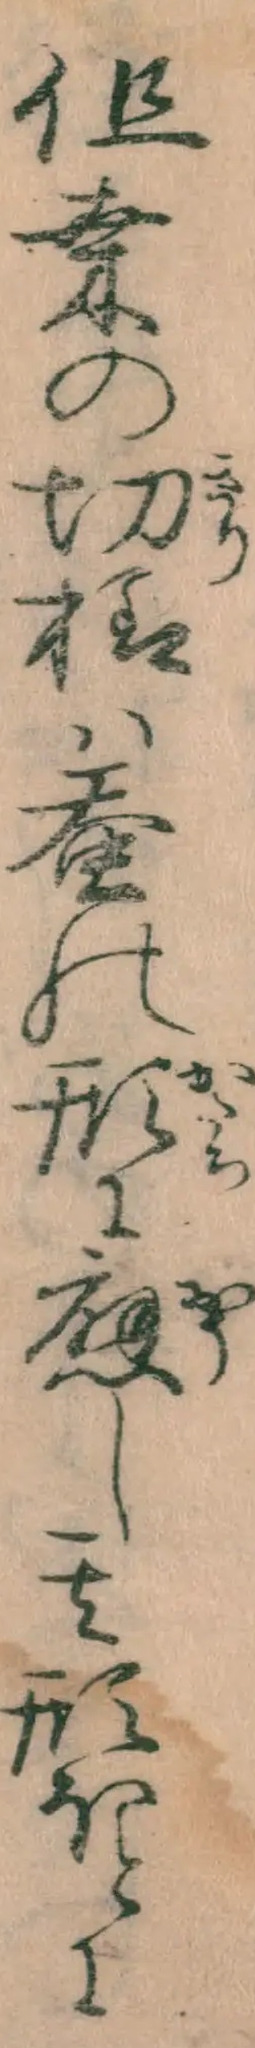但桑の切様は蚕の形に応し其形ほとに
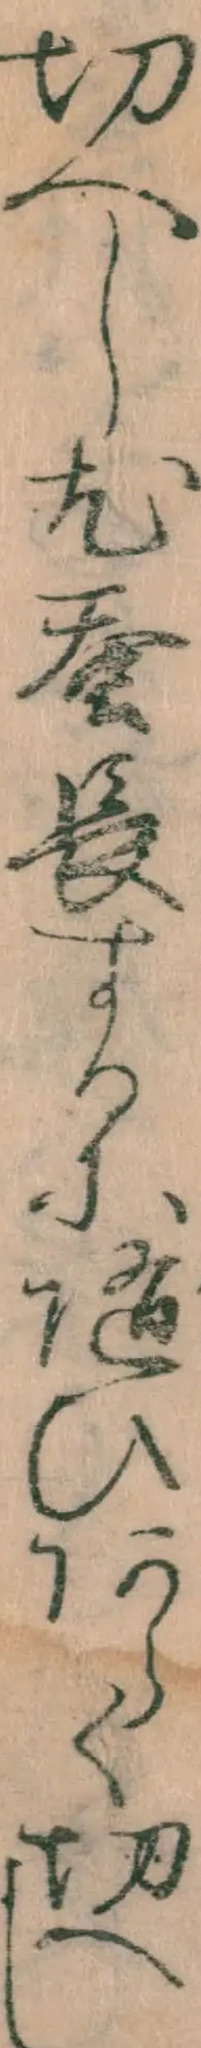切へし尤蚕長するに随ひあらく切へし
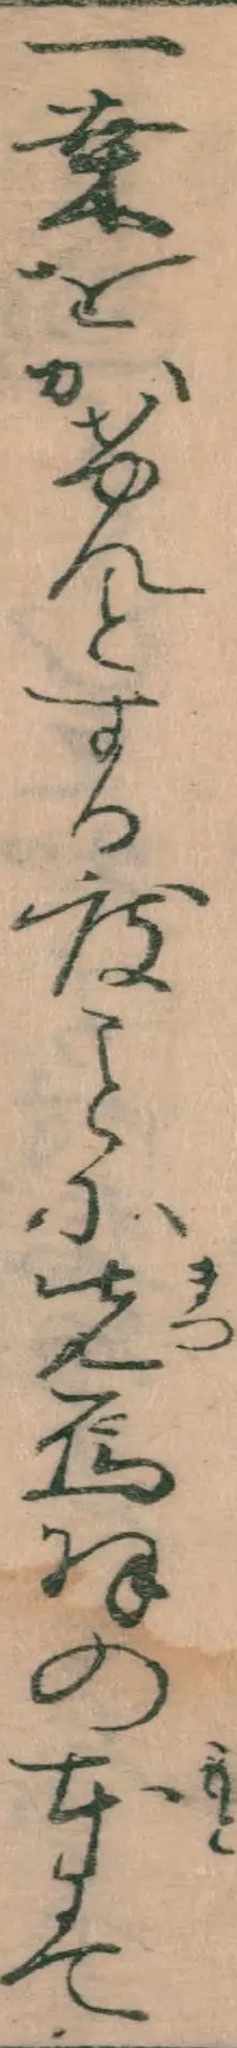一桑をかけんとする度ことに先烏羽の本にて
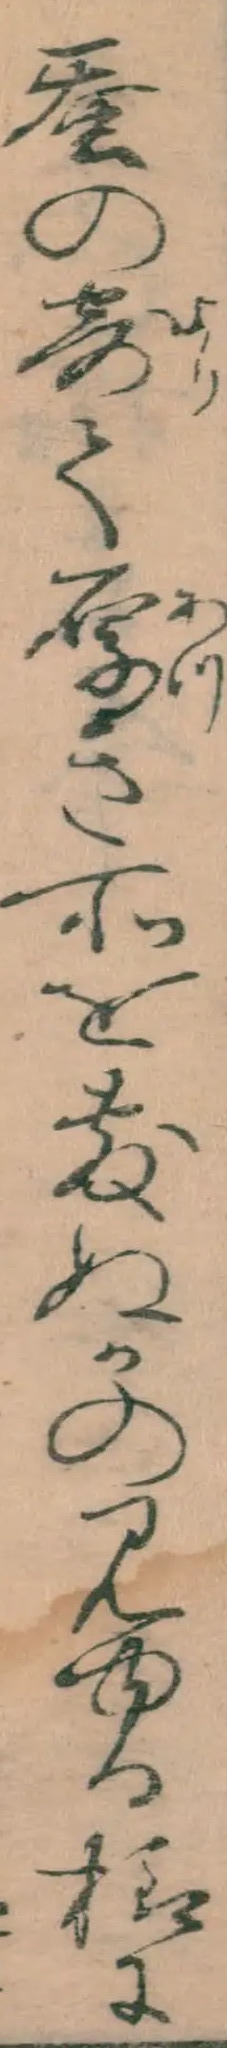蚕の寄て厚き所を敷ぬかの見ゆる様に
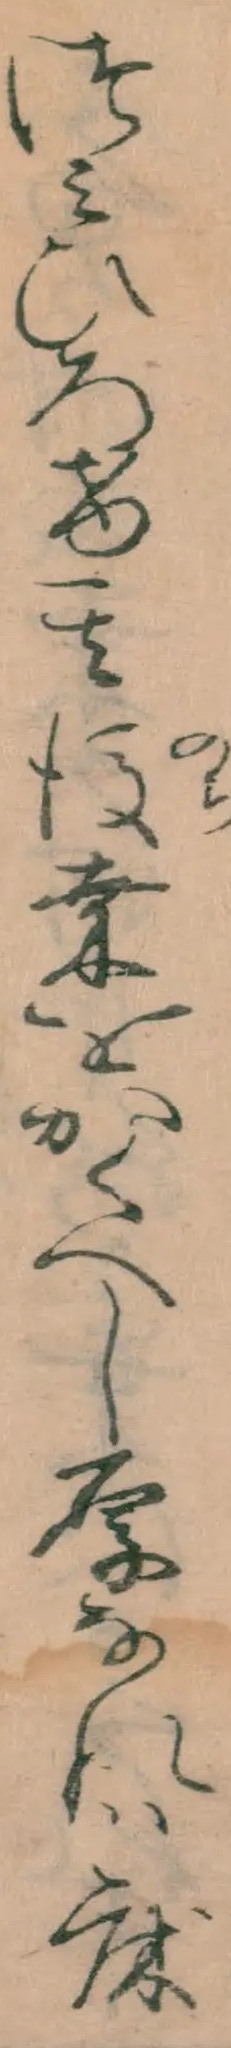つみひろけ其後桑をかくへし厚なれは床
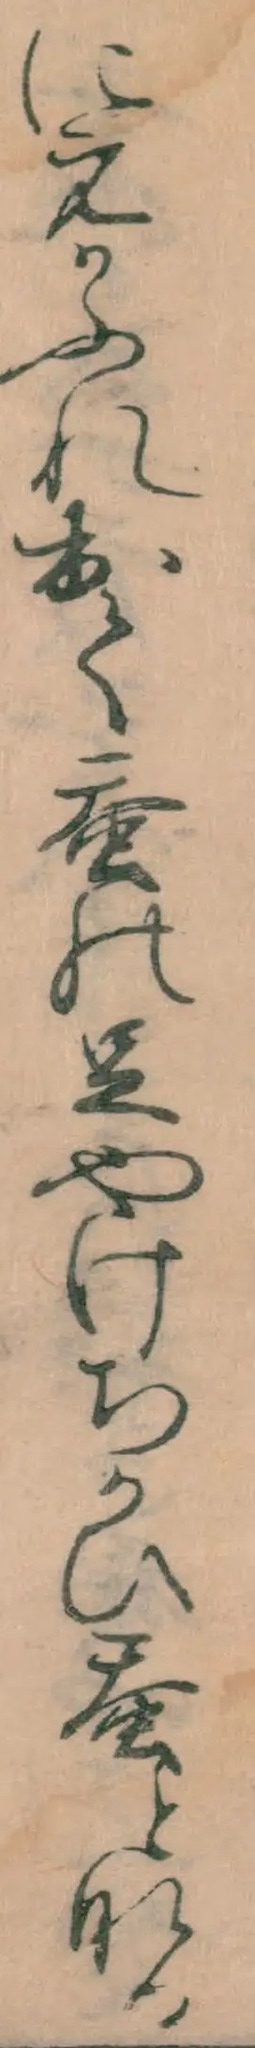に元かふれ出て蚕の足やけちかひ蚕となる
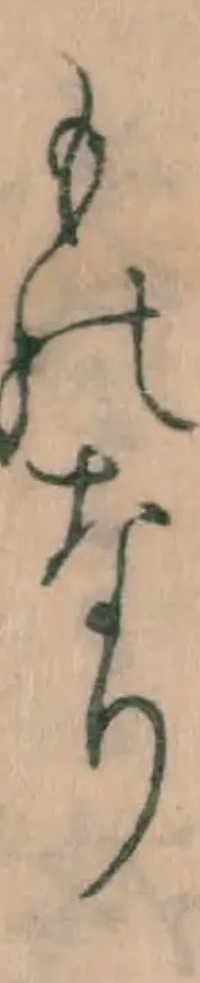ものなり
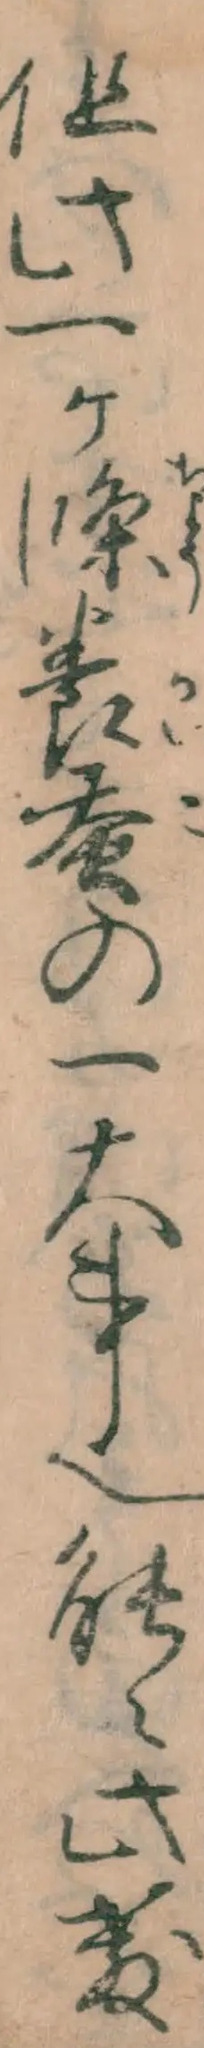但此一ヶ条養蚕の一大事也能々此教
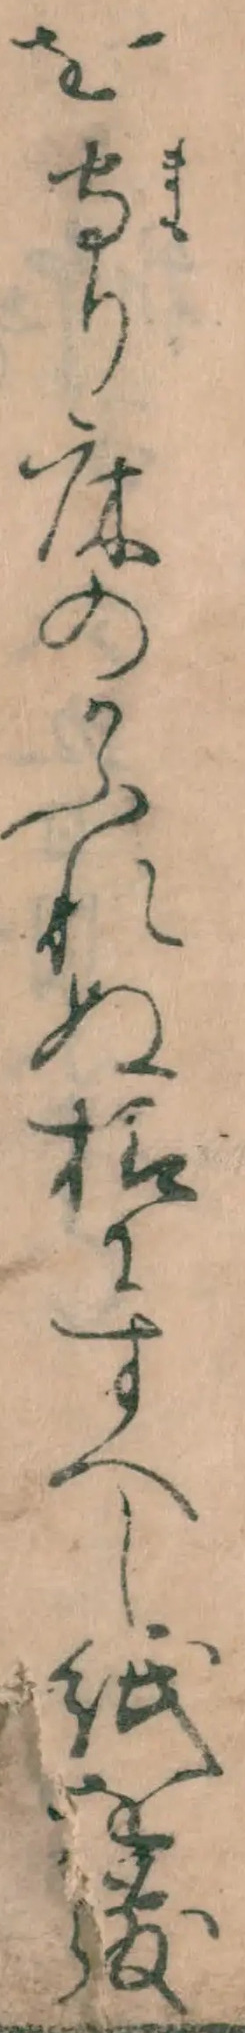を守り床のかふれぬ様にすへし紙を敷
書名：養蚕手引
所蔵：国立国会図書館 National Diet Library, JAPAN
